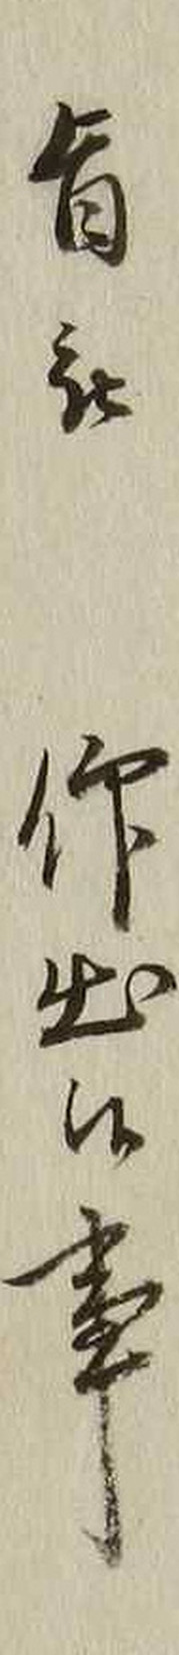旨被仰出候事
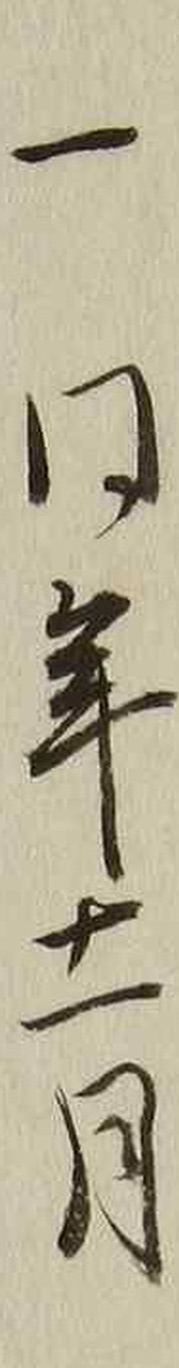一同年土月
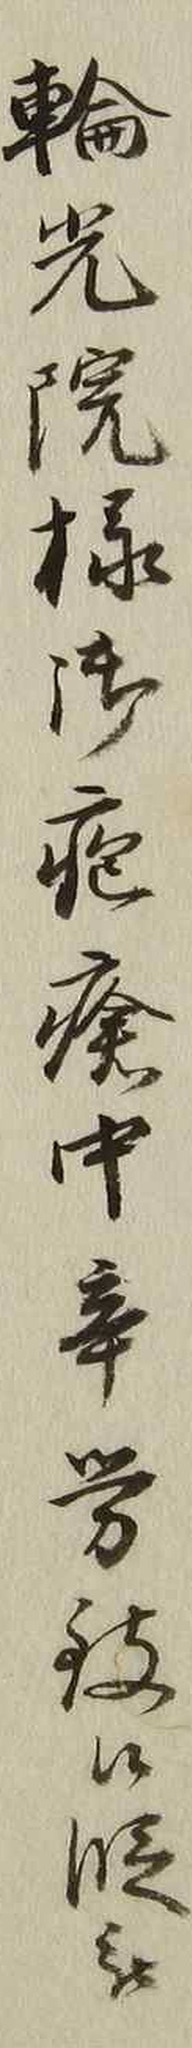輪光院様御疱瘡中辛労致候段被
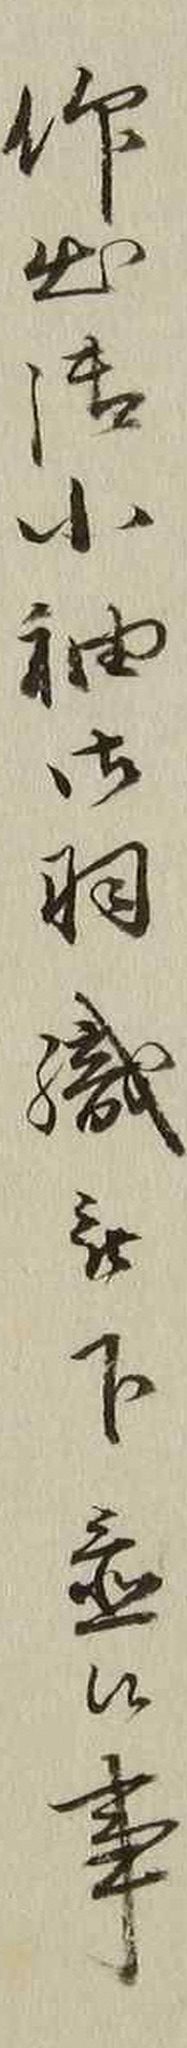仰出御小袖御羽織被下置候事
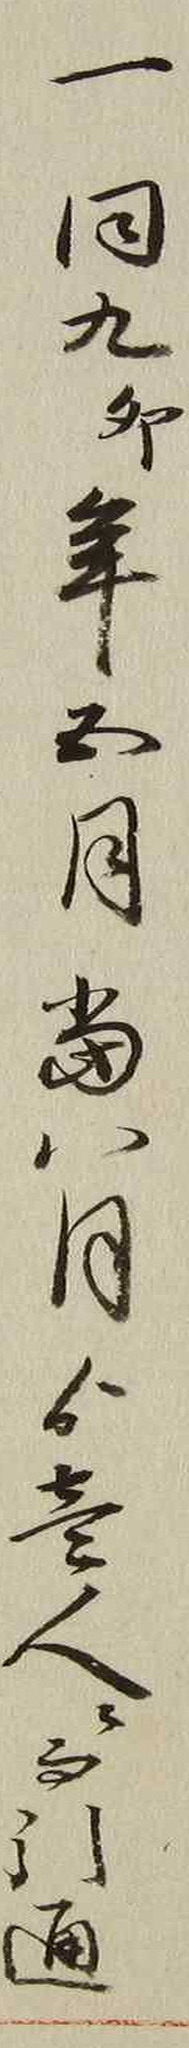一同九卯年五月当八月ゟ壱人ニ而引通
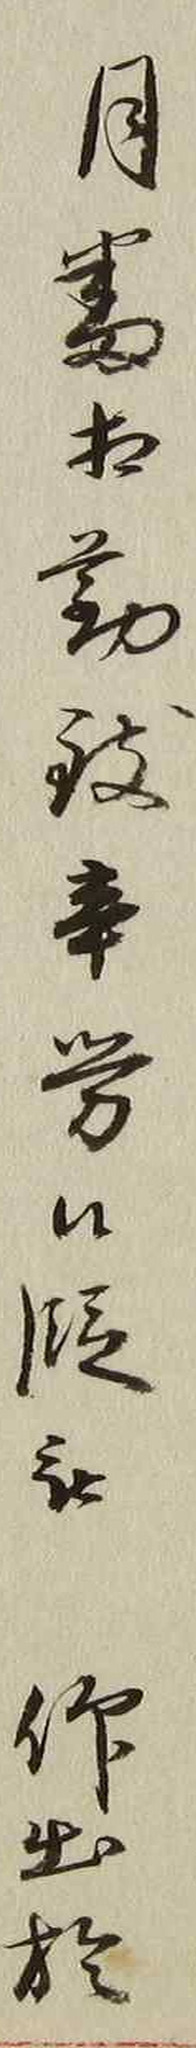月番相勤致辛労候段被仰出於
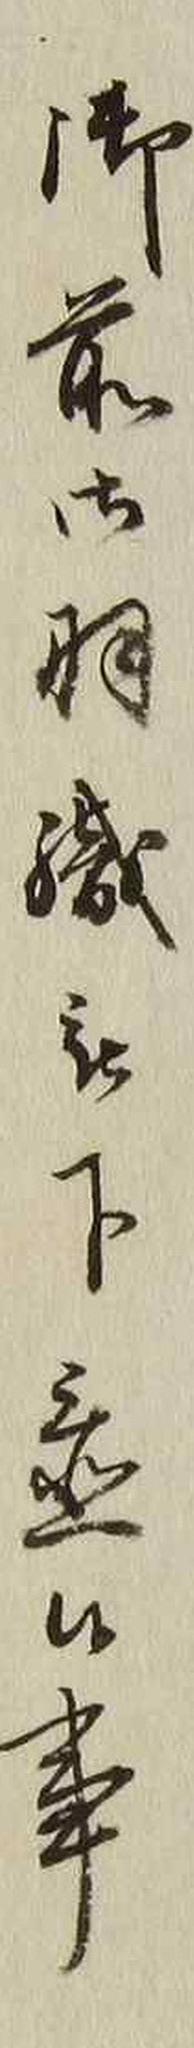御前御羽織被下置候事
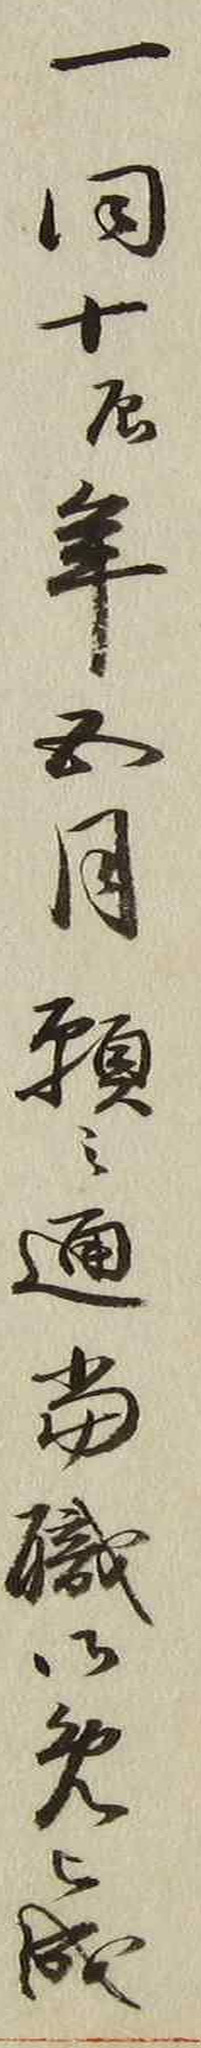一同十辰年五月願之通当職御免被成
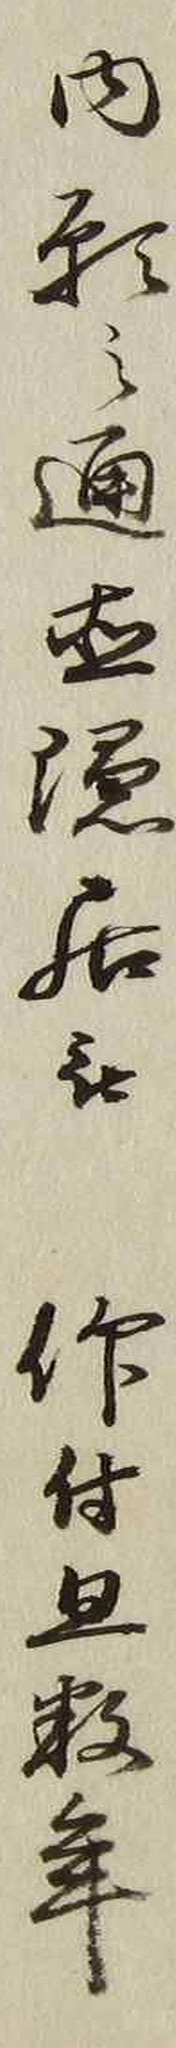内願之通直隠居被仰付且数年
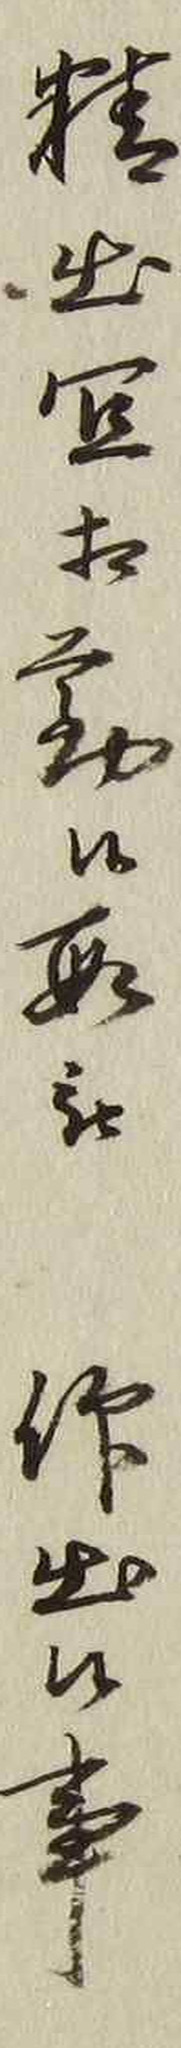精出宜相勤候段被仰出候事
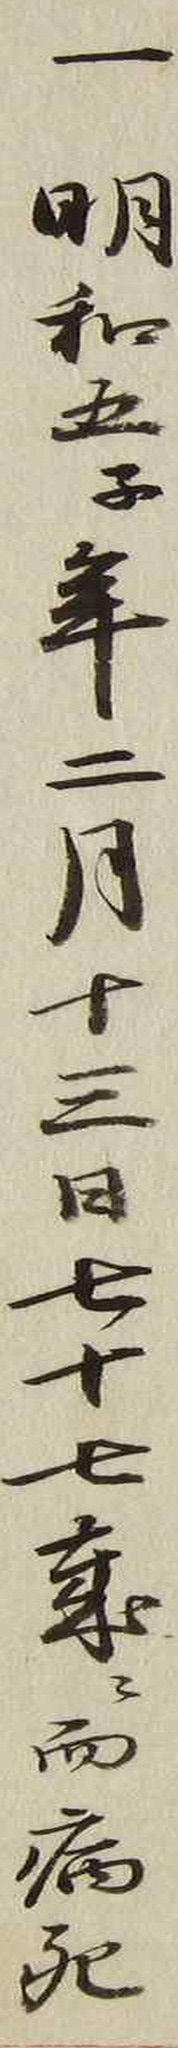一明和五子年二月十三日七十七歳に而病死
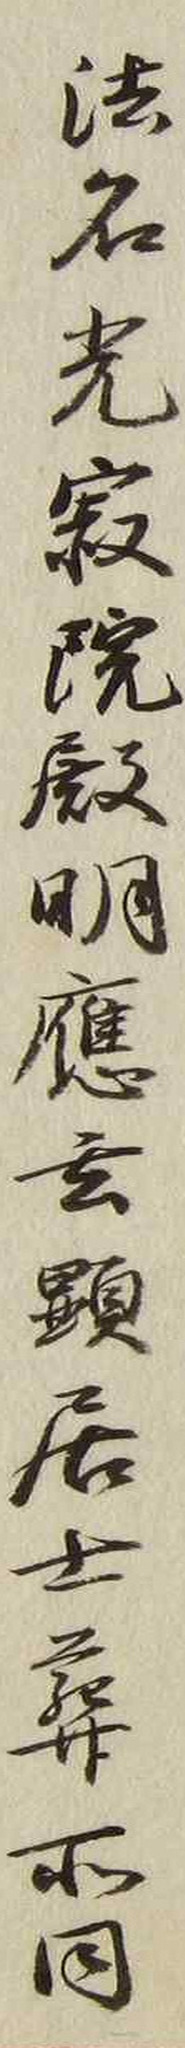法名光寂院殿明応玄顕居士葬所同

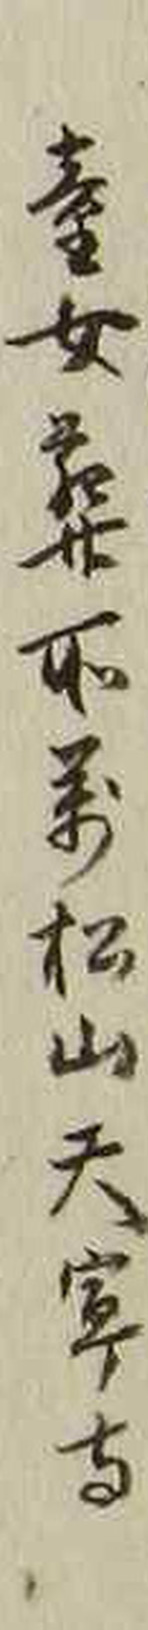童女葬所万松山天寧寺
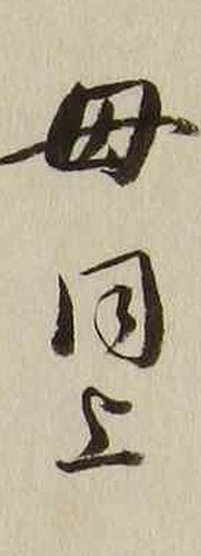母同上
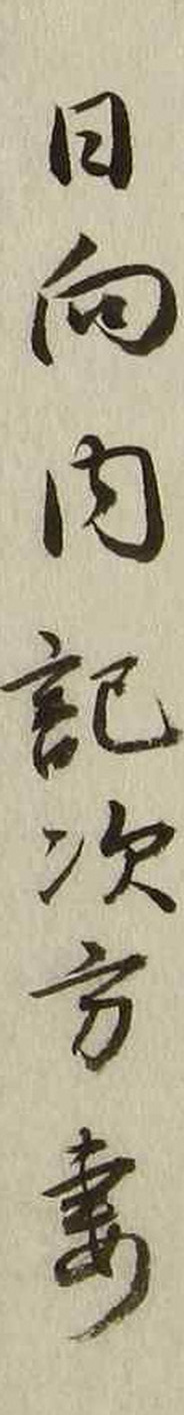女日向内記次方妻
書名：諸士系譜　巻之125　た之部1
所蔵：会津若松市立会津図書館
